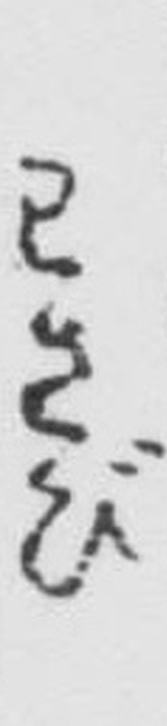わさび
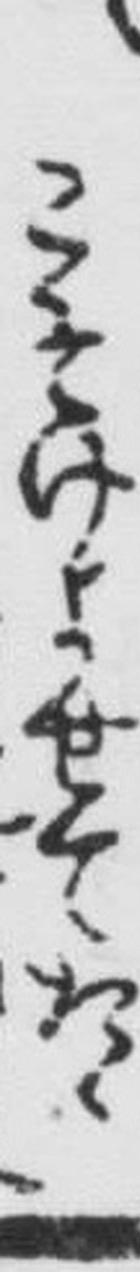こそけよせてたゝ
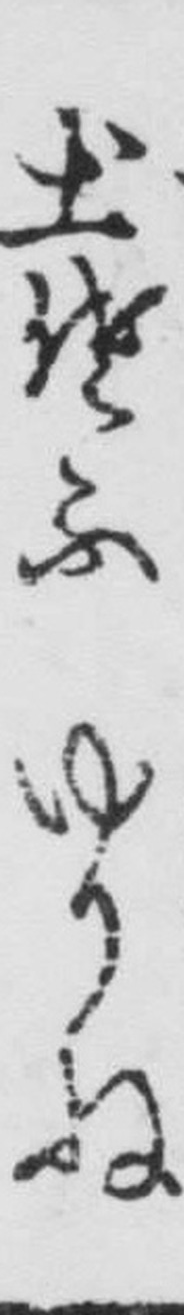土佐ふゆりね
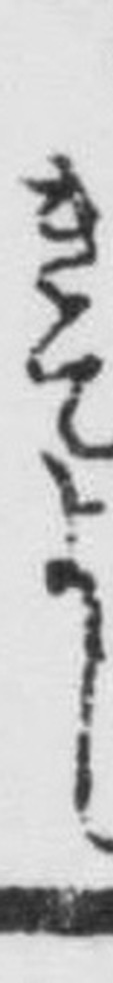きてよし
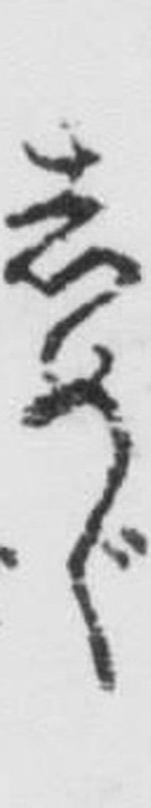しめじ
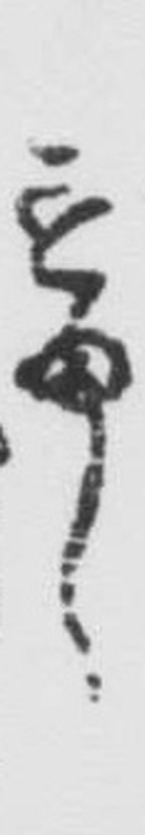すまし
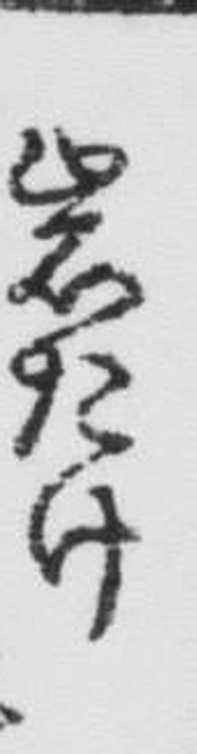岩たけ
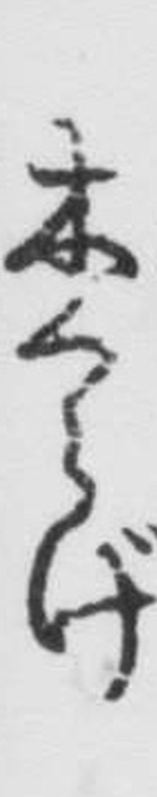木くらげ
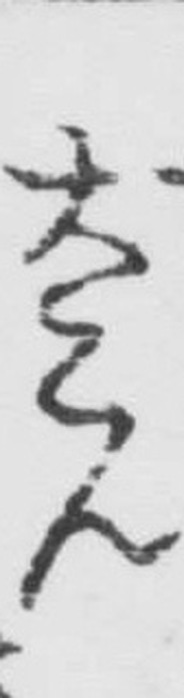大こん
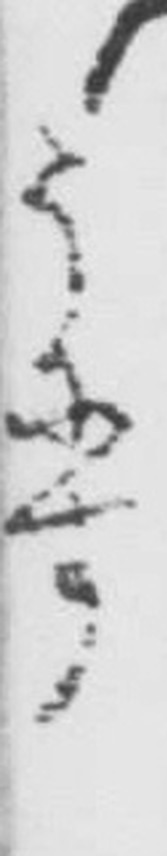うにす
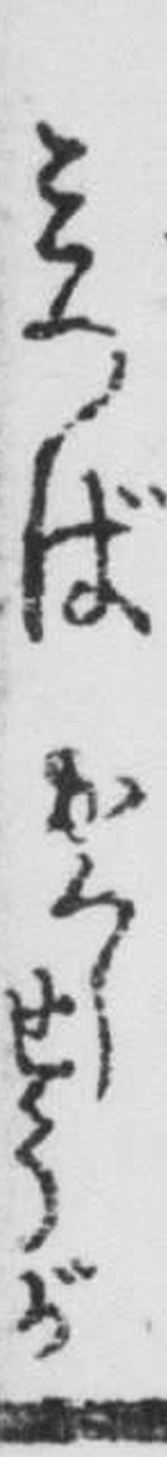みつばかくしせうが
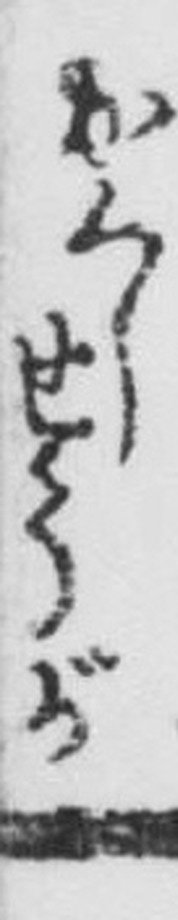かくしせうが
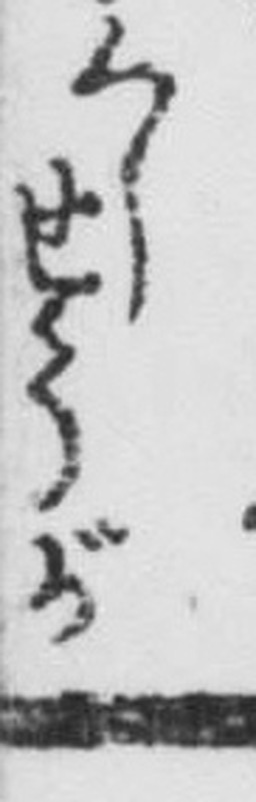せうが

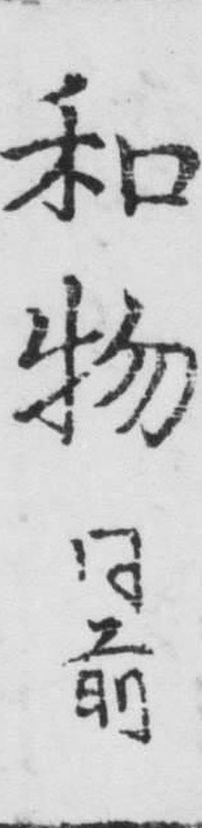煮物同前
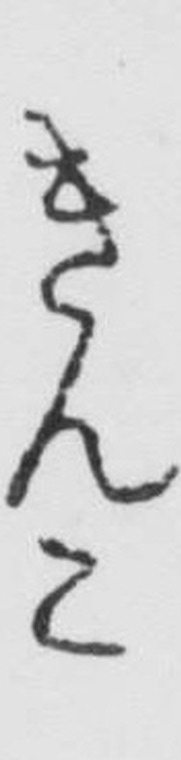きんこ
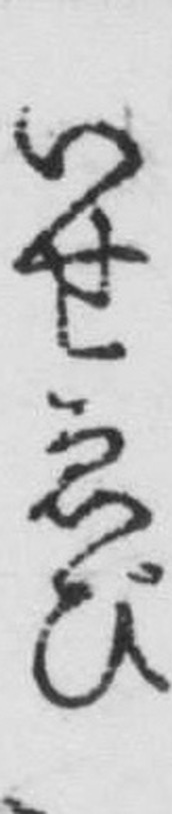いせゑび
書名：諸家通用/即席料理
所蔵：大阪府立大学学術情報センター 国文学研究資料館
